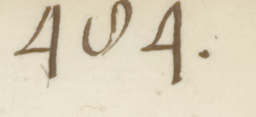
484.
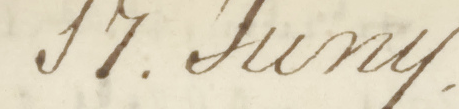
17. Juny.
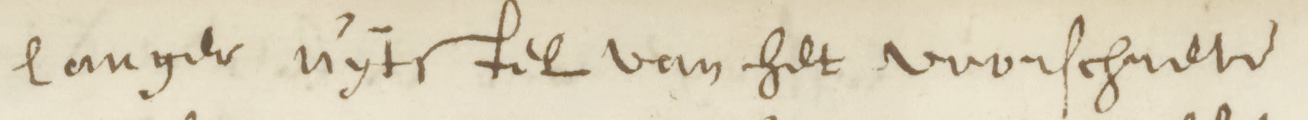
langer uijtstel van het voorschreve
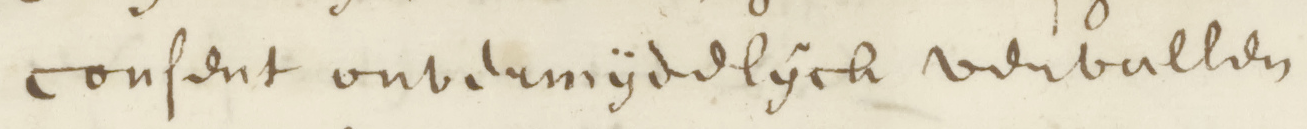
consent onvermijdelijck vervallen
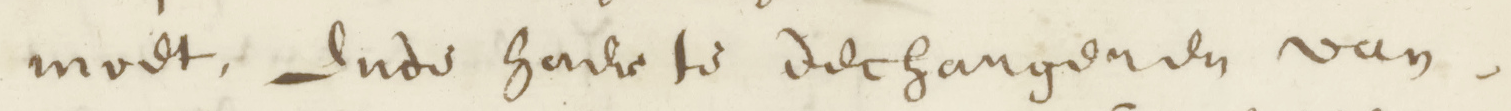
moet, ende haer te dechargeren van
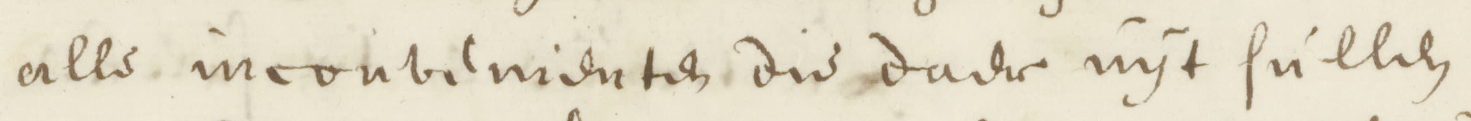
alle inconvenienten die daer uijt sullen
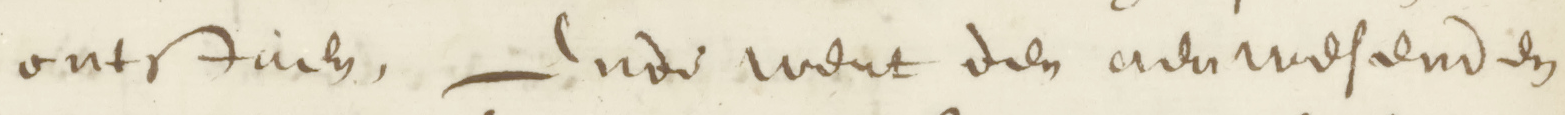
ontstaen. Ende wert den aenwesenden
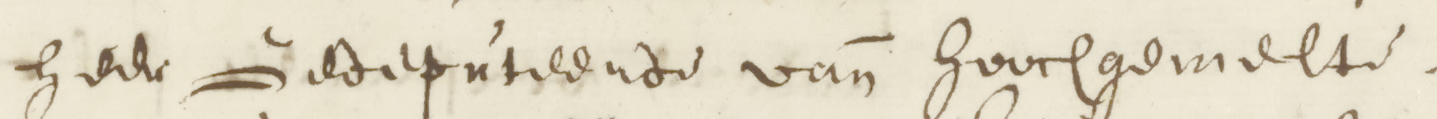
heer Gedeputeerde van hoochgemelte
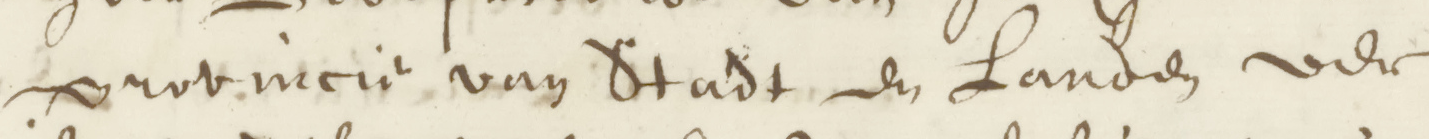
provincie van Stadt en Landen ver„
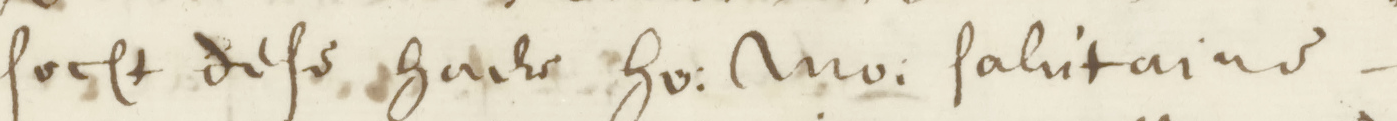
socht dese haer ho:Mo: salutaire
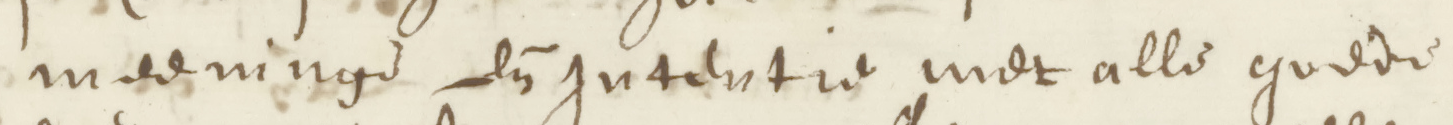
meeninge en intentie met alle goede
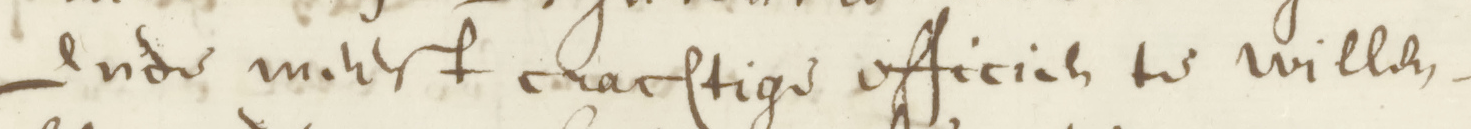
ende meest crachtige officien te willen
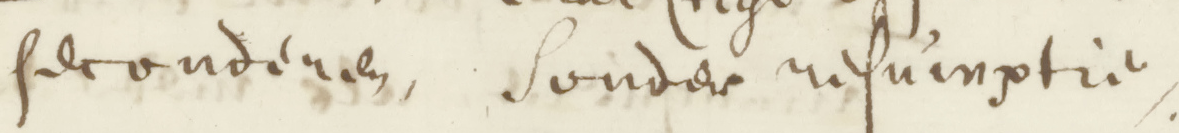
seconderen, sonder resumptie.
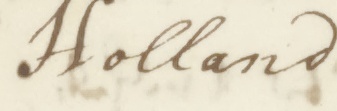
Holland
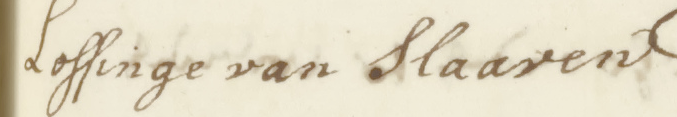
Lossinge van Slaaven
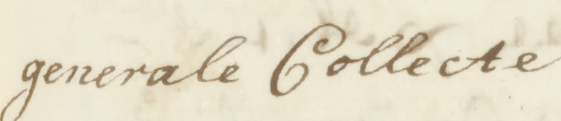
generale Collecte
